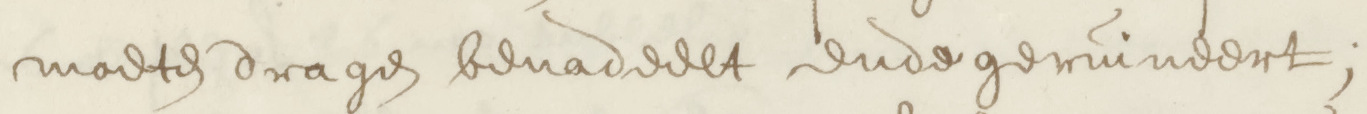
moeten dragen benadeelt ende geruineert;
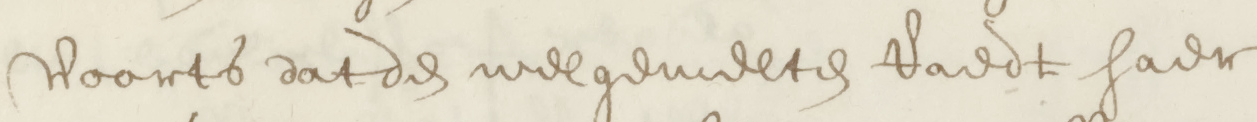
Voorts dat den welgemelten Raedt haer
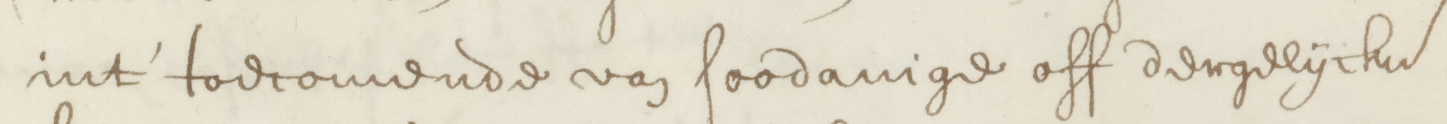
int' toecomende van soodanige off dergelijcke
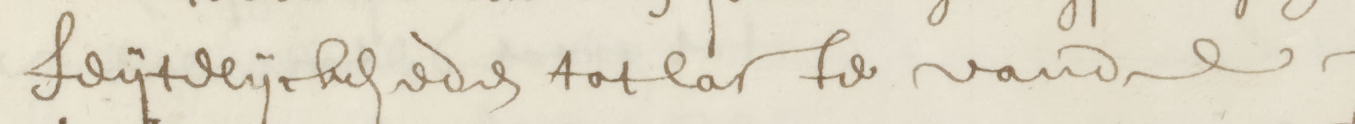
feijtelijckheden tot laste vande
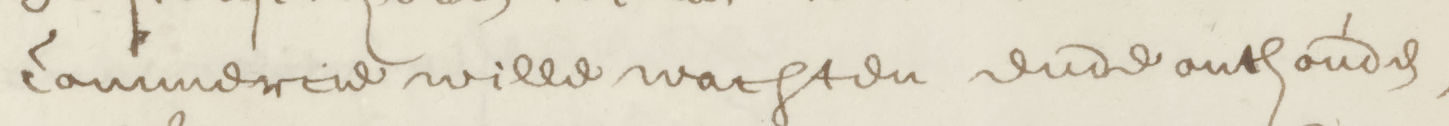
Commercie wille wachten ende onthouden,
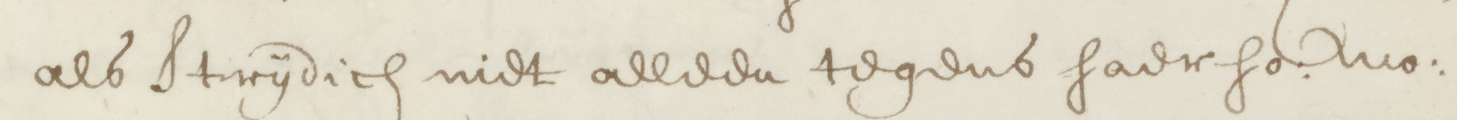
als Strijdich niet alleen tegens haer Ho:Mo:
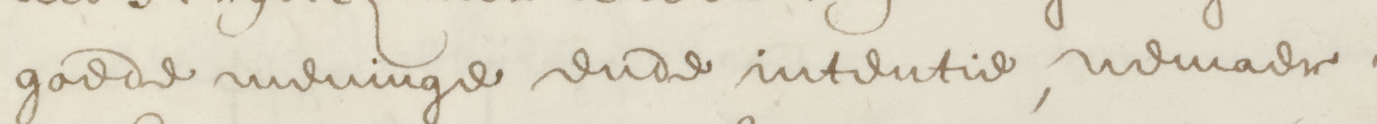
goede meninge ende intentie, nemaer
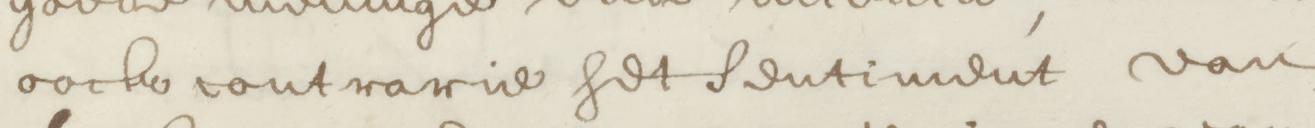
oock contrarie het sentiment van
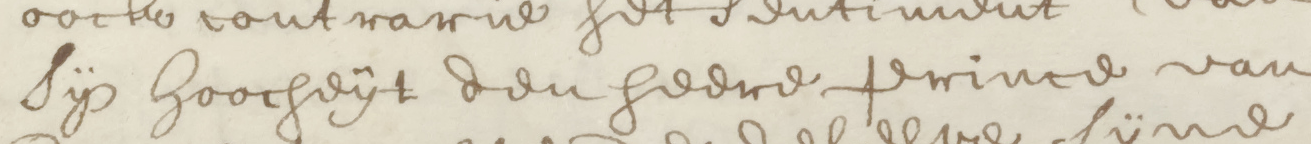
Sijn hoocheijt den heere Prince van
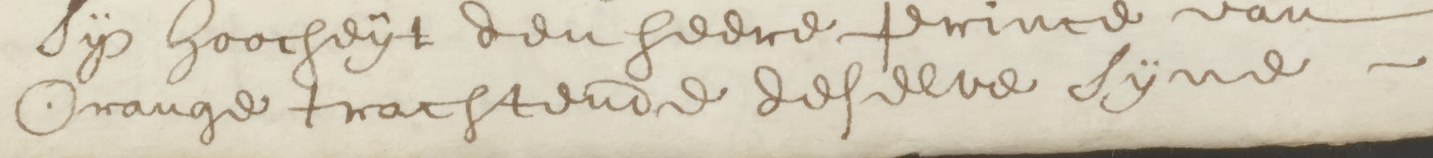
Orange trachtende deselve Sijne -
